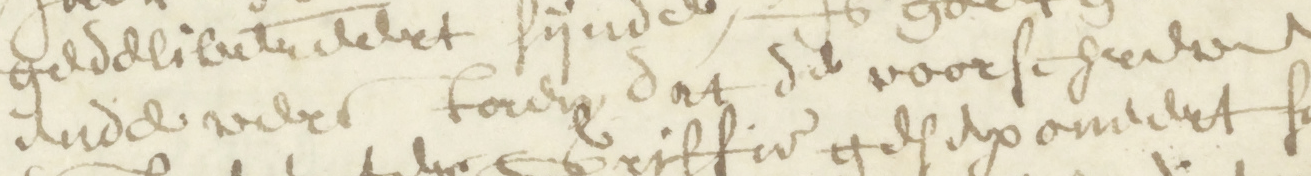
ende verstaen, dat de voorschreve
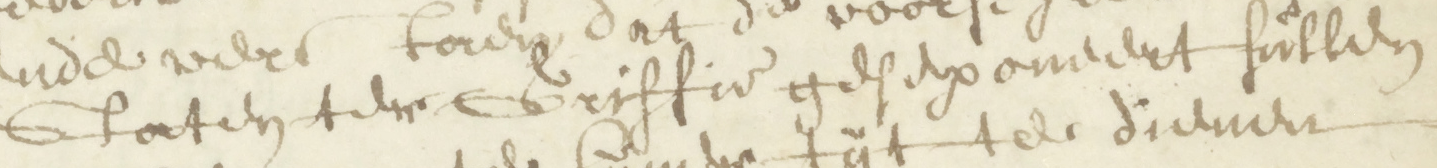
Staten ter Griffie geseponeert sullen
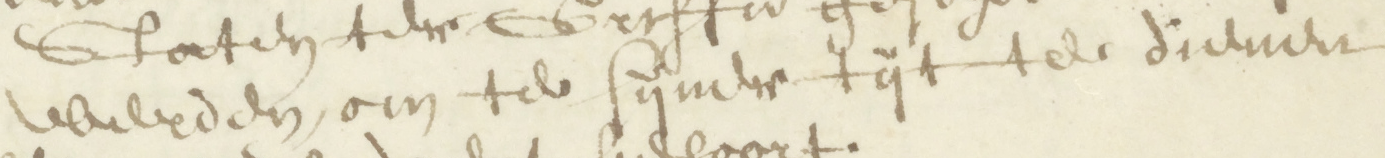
werden, om te sijner tijt te dienen
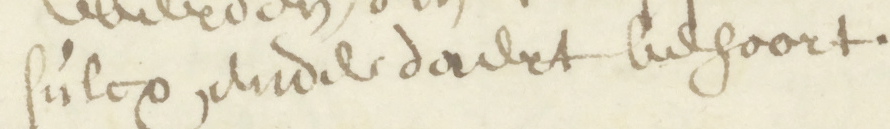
sulcx ende daert behoort.
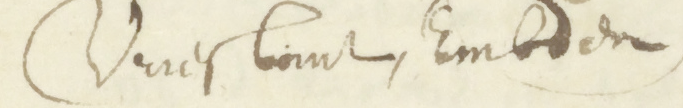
Vrieslant, Embden
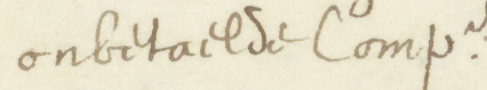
onbetaelde Compen.
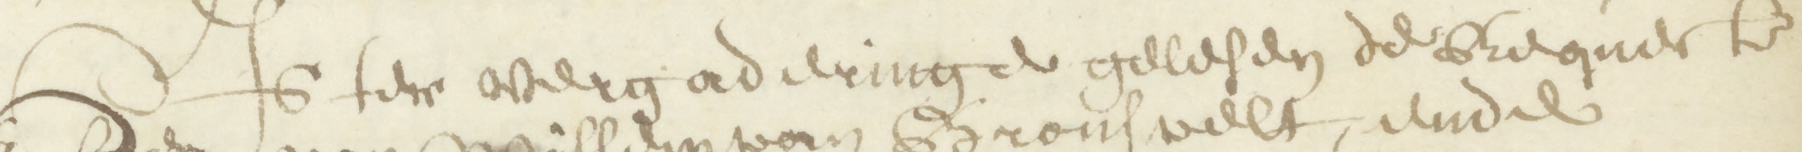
Is ter Vergaderinge gelesen de Requeste
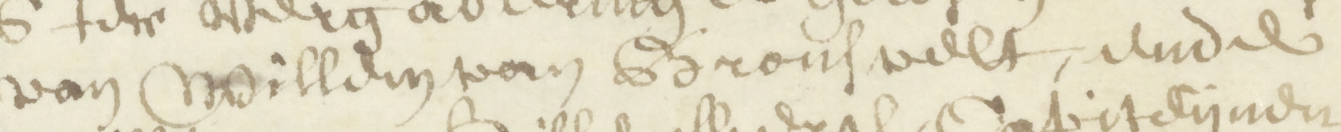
van Willem van Bronsvelt, ende
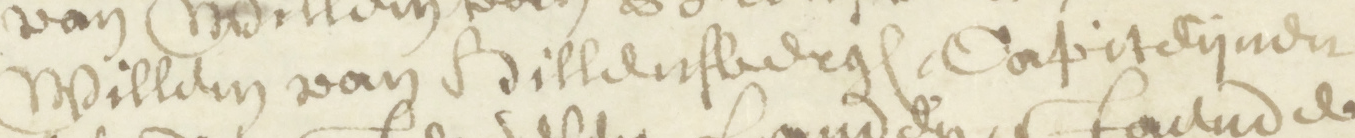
Willem van Hillensbergh, Capiteijnen
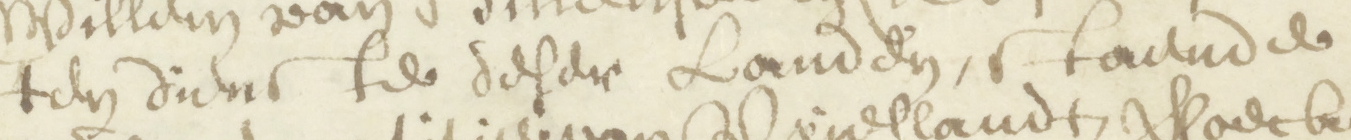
ten dienste deser Landen, staende
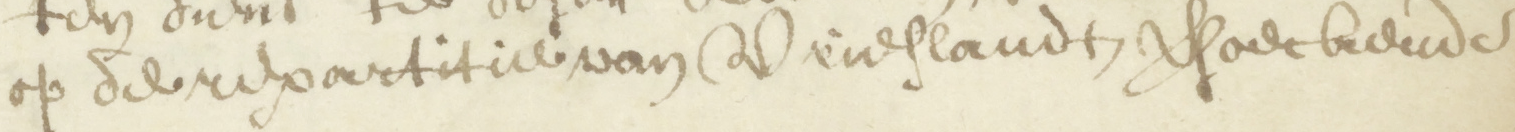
op de repartitie van Vrieslandt, vsoeckende
